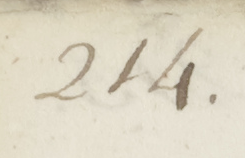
214.
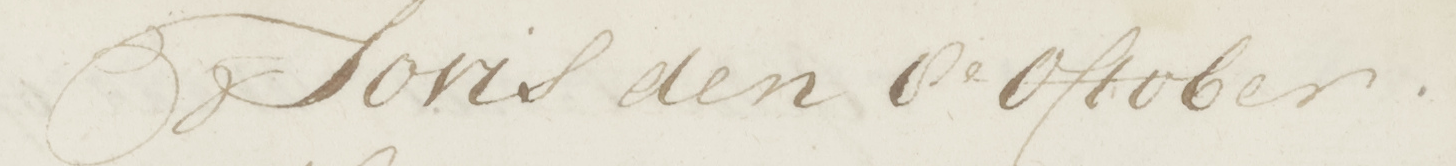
Jovis den 8e October .
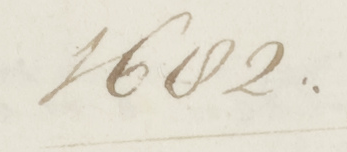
1682.
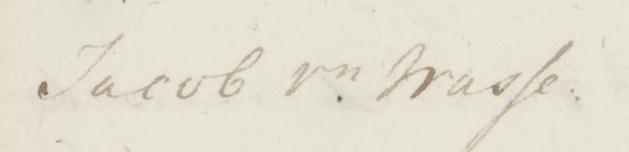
Jacob vn. Wasse„
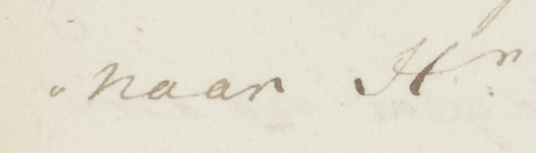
„naar Hr:
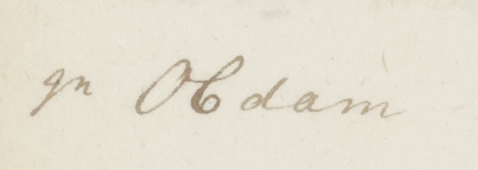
in Obdam
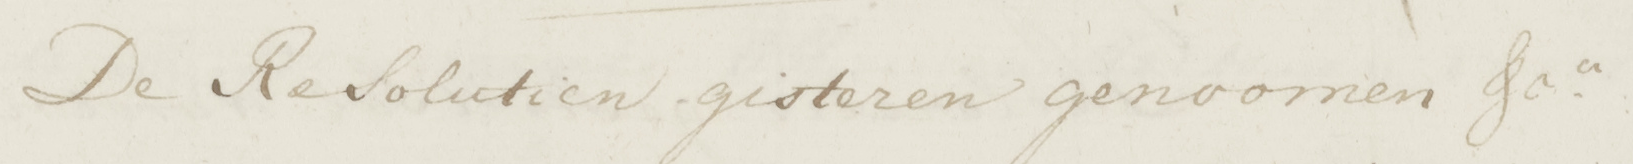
De Resolutien gisteren genoomen &ca.
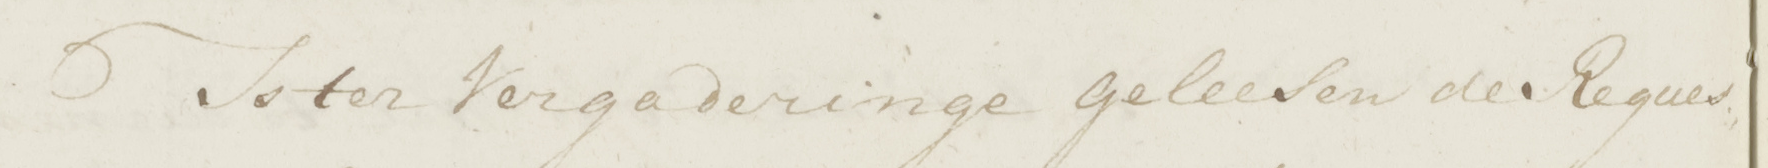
Is ter Vergaderinge geleesen de Reques„
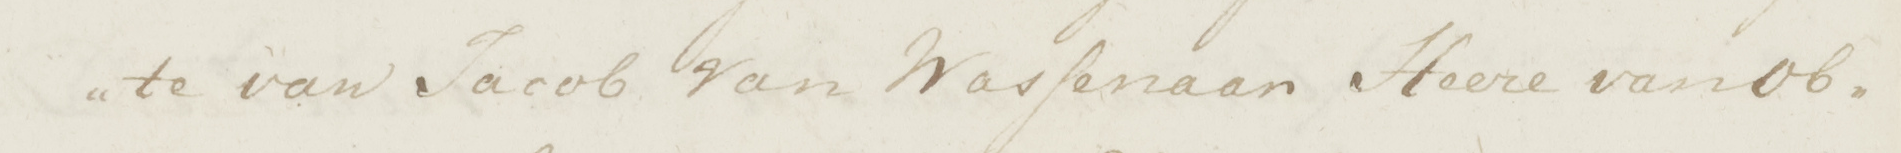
„te van Jacob van Wassenaer Heere van Ob„
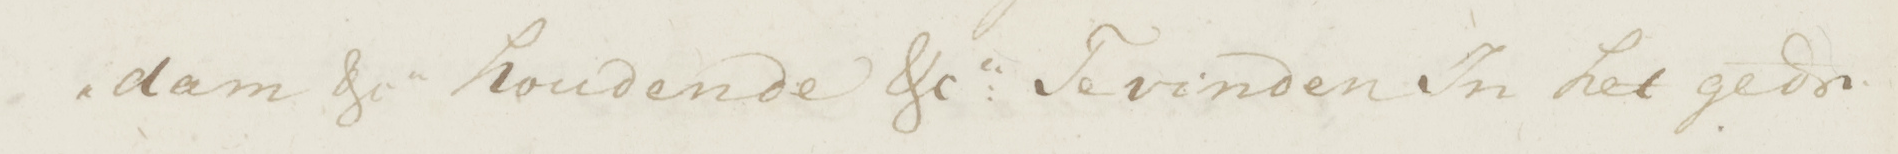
„dam &ca. houdende &ca. Te vinden In het gedr.
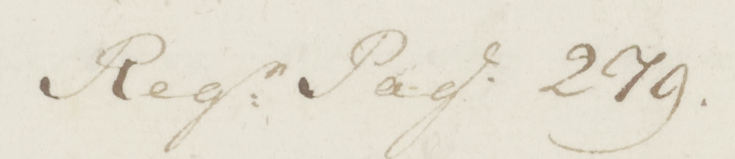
Regr: Pag. 279.
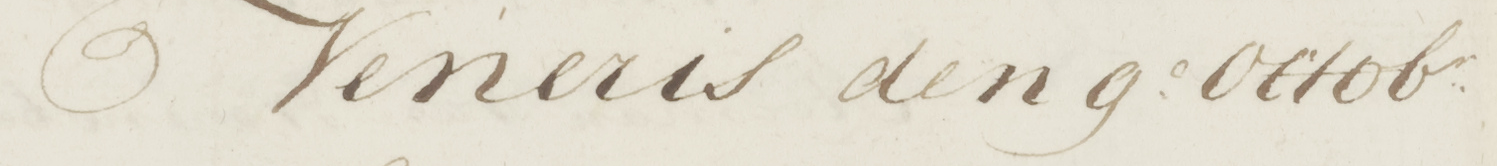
Veneris den 9e. Octobr:
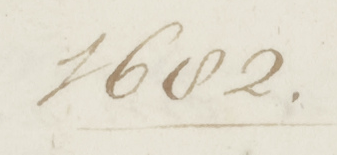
1682.
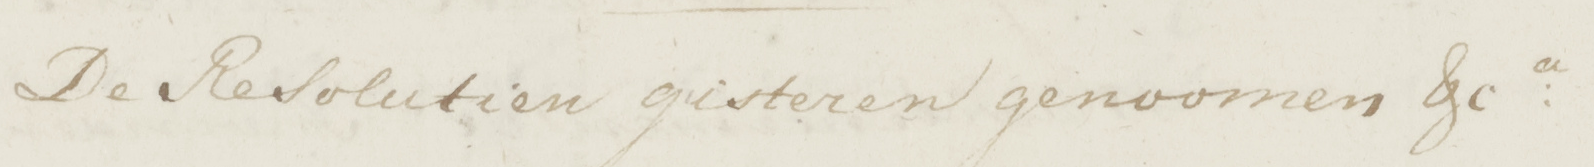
De Resolutien gisteren genoomen &ca.
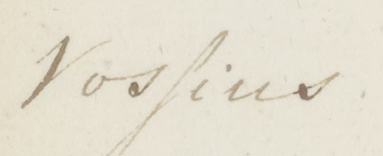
Vossius
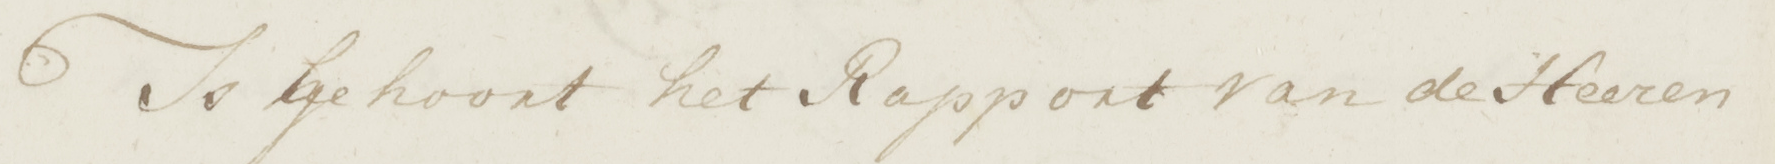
Is hgehoort het Rapport van de Heeren
